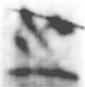之
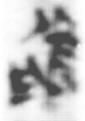雘
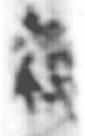紳（靷）
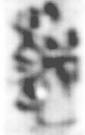○（豻）
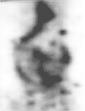首
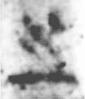之
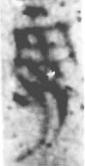○（蒙）
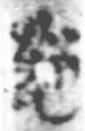○（豻）
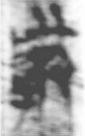鞁
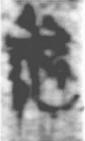○（轡）
